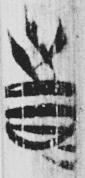之日
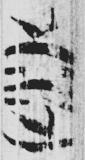涉
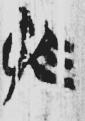於
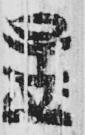孟
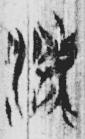○（津）
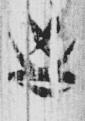至
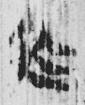於
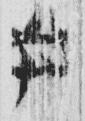共
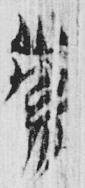○（縢）
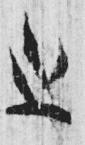之
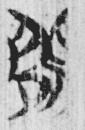○（間）
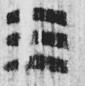三
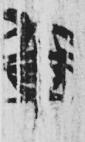軍
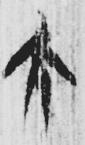大
